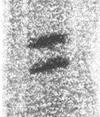二
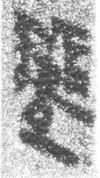箂
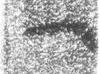一
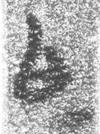白
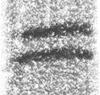二
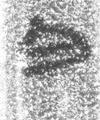白
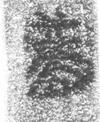{虍角}
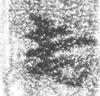屯
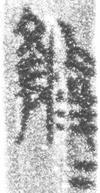雀韋
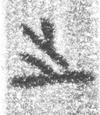之
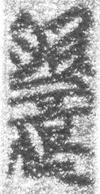○（韜）
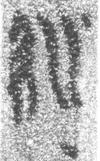紃
